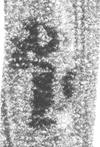{吅亞爪}
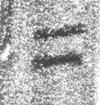二
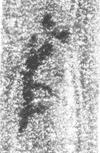厀（漆）
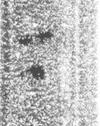二
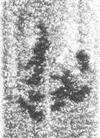彫（雕）
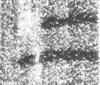二
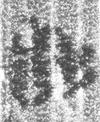彫（雕）
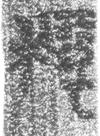○（爵）
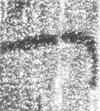一
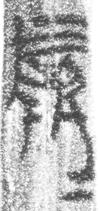奉厚
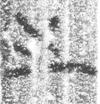之
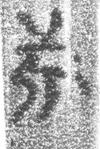○（巹）
